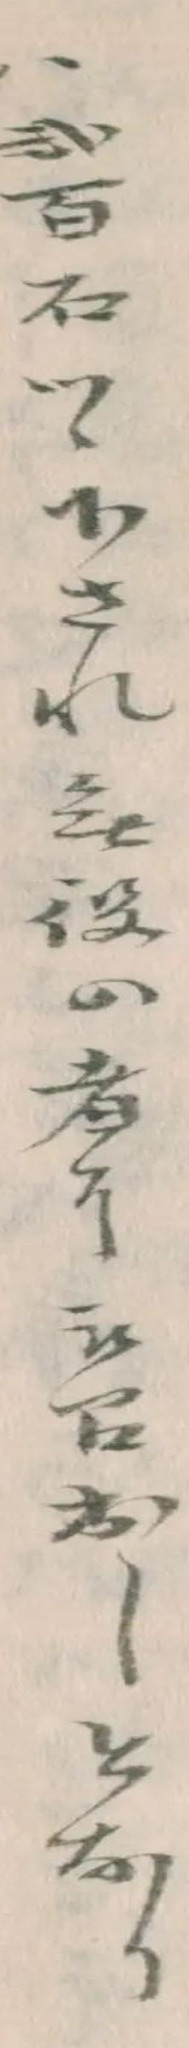は二百石つゝ下され無役の者に被召出しとなり
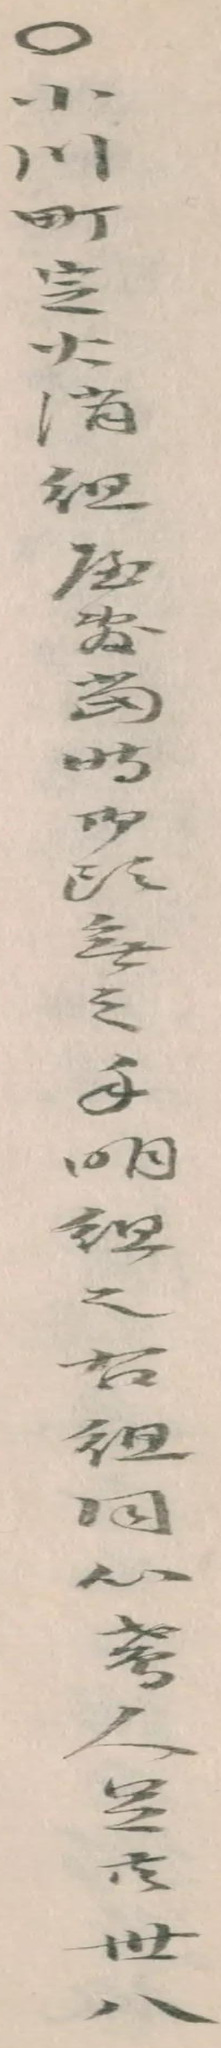〇小川町定火消組屋敷当時御頭無之手明組也右組同心鳶人足共丗八
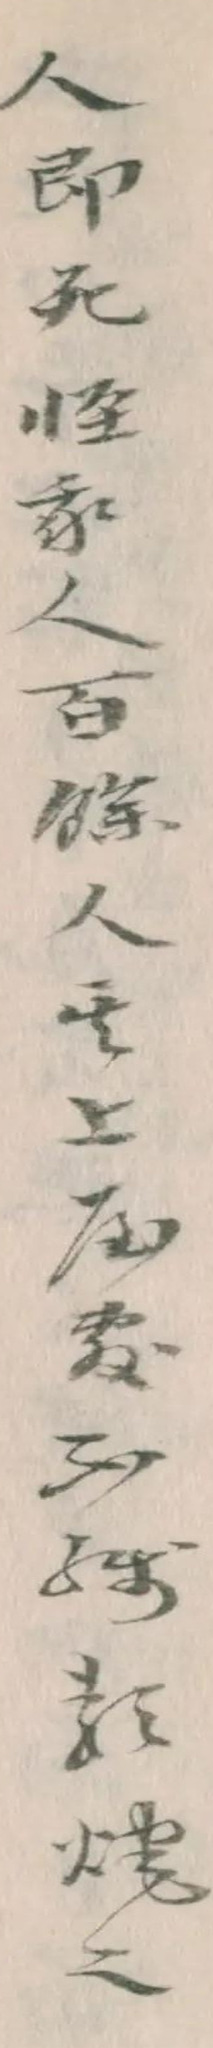人即死怪我人百余人其上屋敷不残類焼也
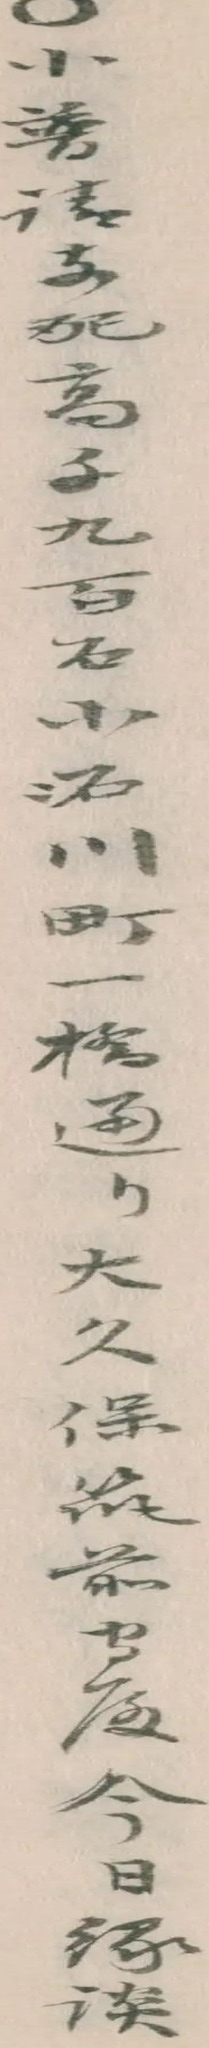〇小普請支配高千九百石小石川町一橋通り大久保筑前守殿今日縁談
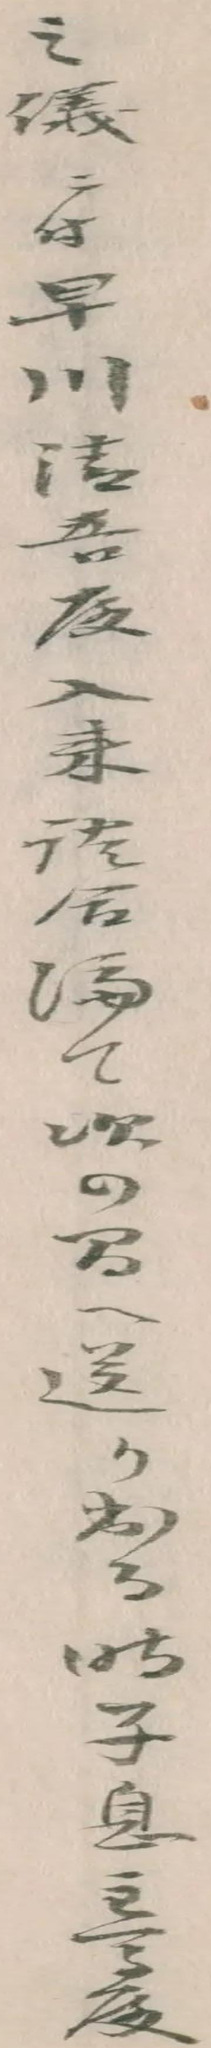之儀付早川清吾殿入来談合済て次の間へ送り出る時子息主馬殿
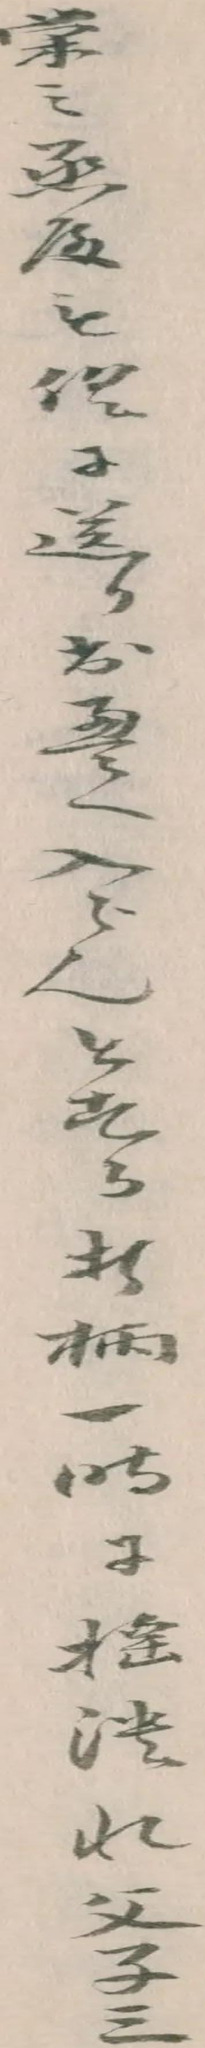栄之丞殿も倶に送り出奥へ入らんとする折柄一時に揺潰れ父子三
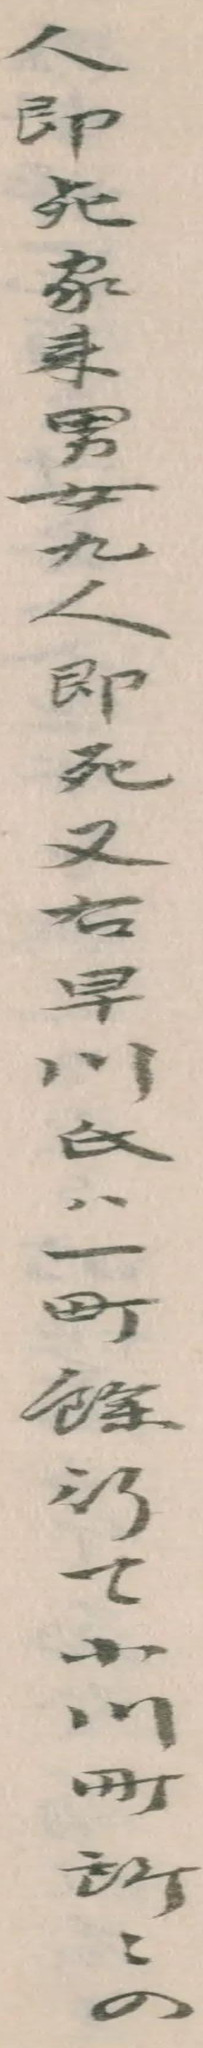人即死家来男女九人即死又右早川氏は一町余行て小川町所々の
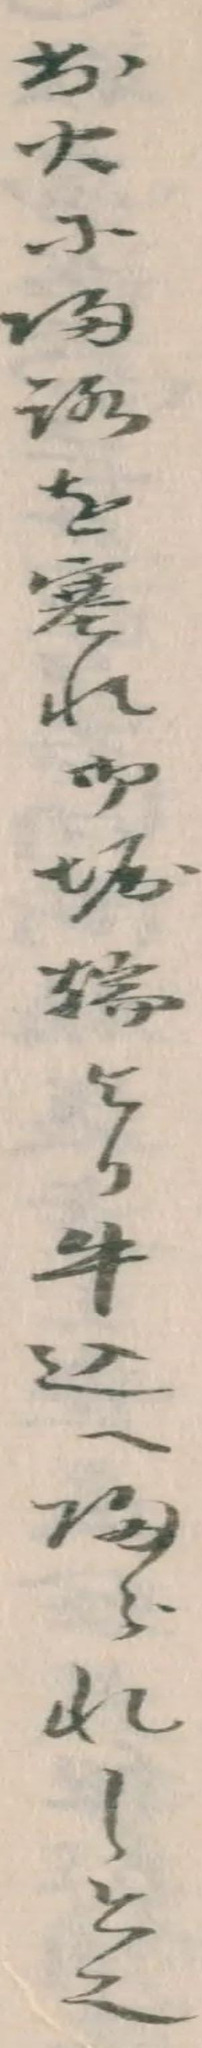出火に帰路を塞れ御堀端より牛込へ帰られしと也
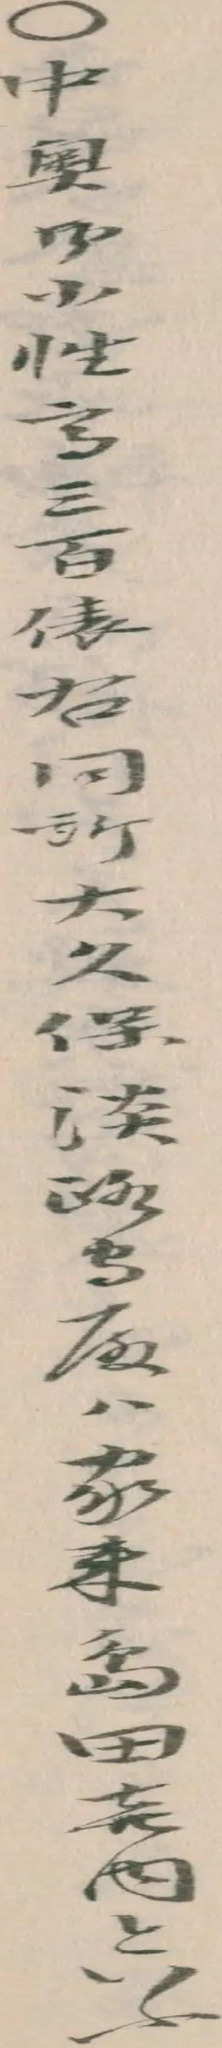〇中奥御小姓高三百俵右同所大久保淡路守殿は家来島田喜内といふ
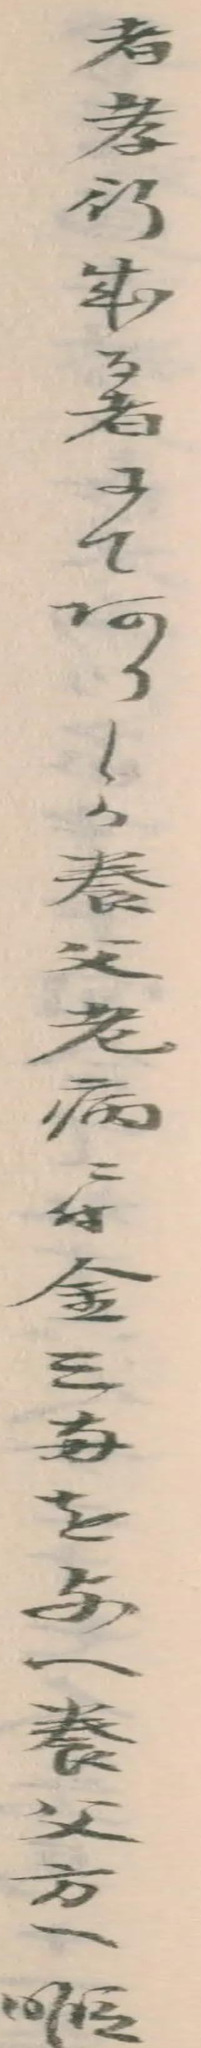者孝行成る者にてありしか養父老病付金三両を与へ養父方へ暇
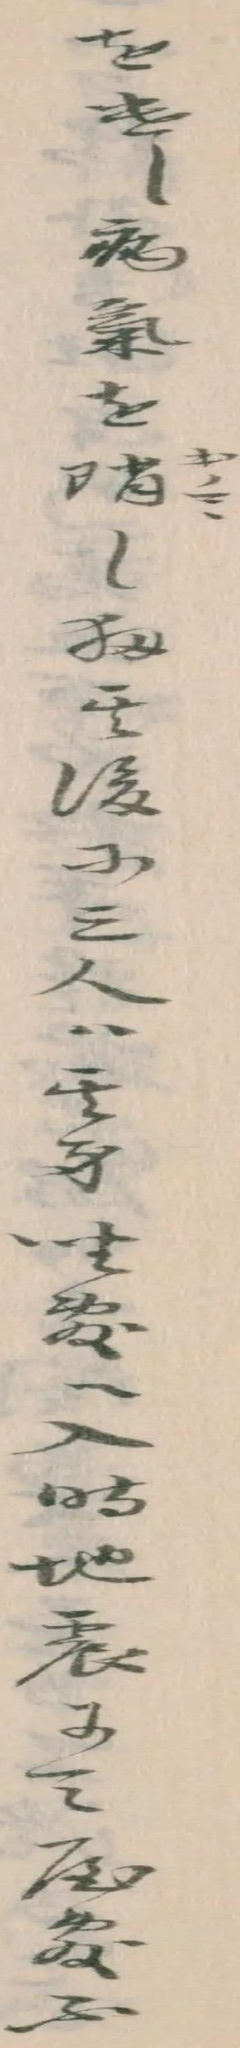を遣し病気を陏し扨其後に三人は其身坐敷へ入時地震にて屋敷不
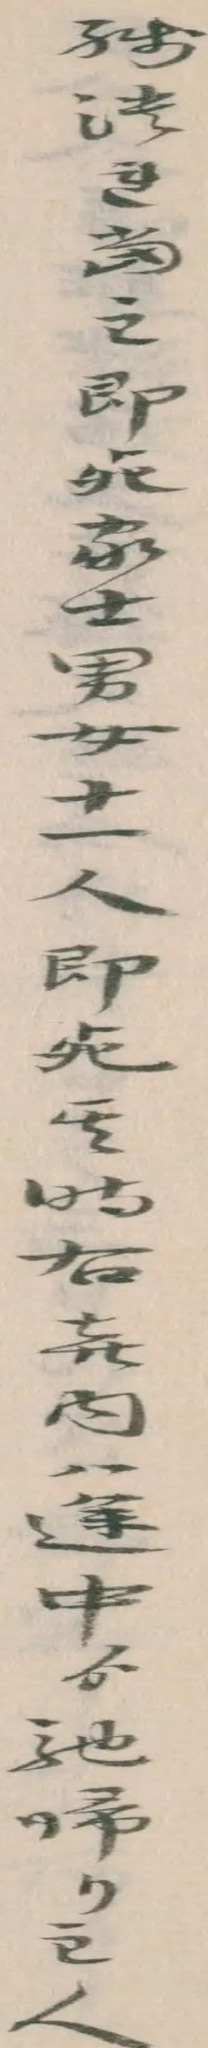残潰れ当主即死家士男女十一人即死其時右喜内は途中ゟ馳帰り主人
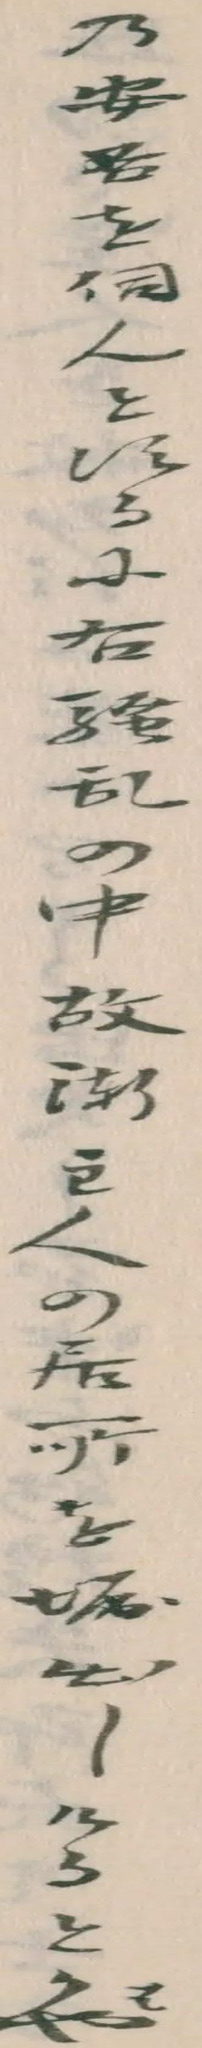の安否を伺んとするに右騒乱の中故漸主人の居所を掘出しけるとかはや
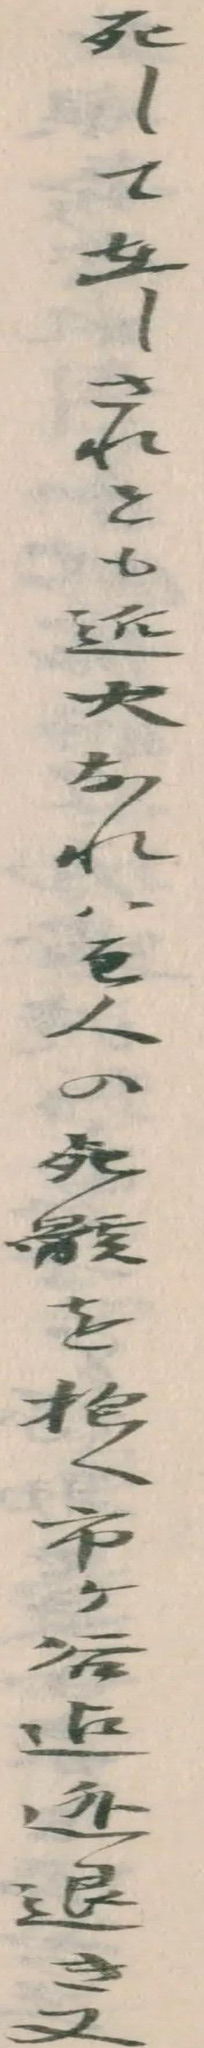死して在しされとも近火なれは主人の死骸を抱へ市ヶ谷迄退き又
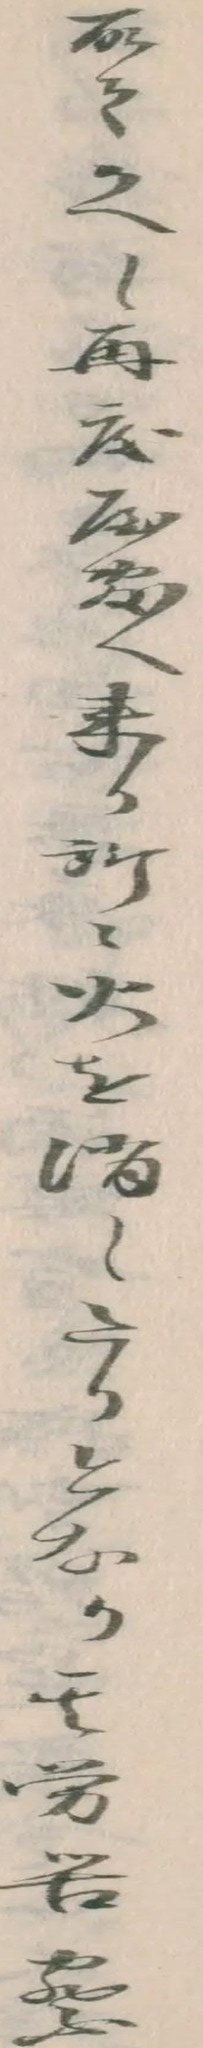取てかへし再度屋敷へ来り所々火を消したりとなり其労苦察
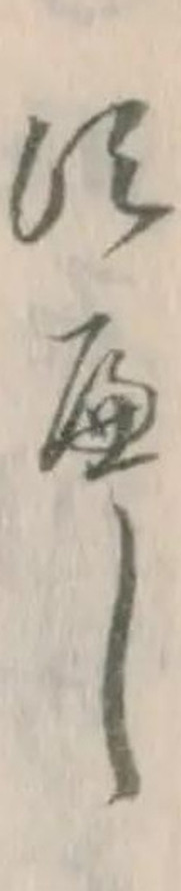すへし
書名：地災撮要. 巻10(地震之部) 上,下
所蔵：国立国会図書館 National Diet Library, JAPAN
